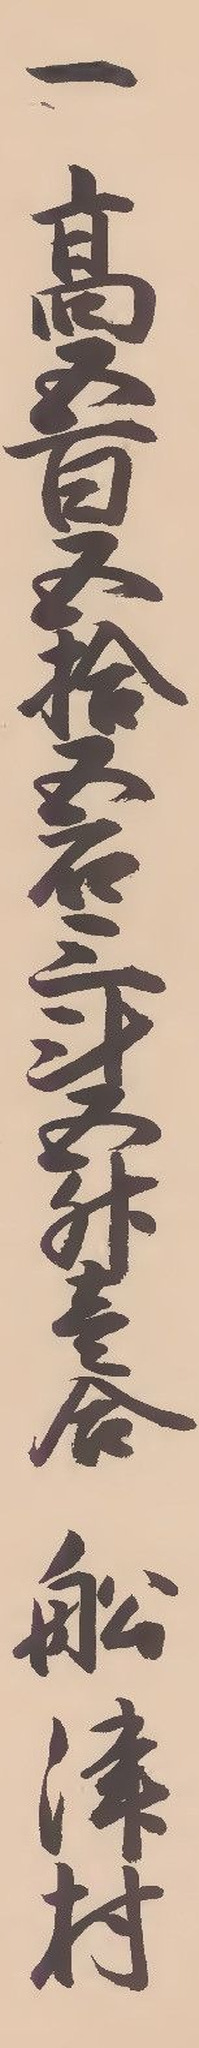一高五百五拾五石三斗五升壱合船津村

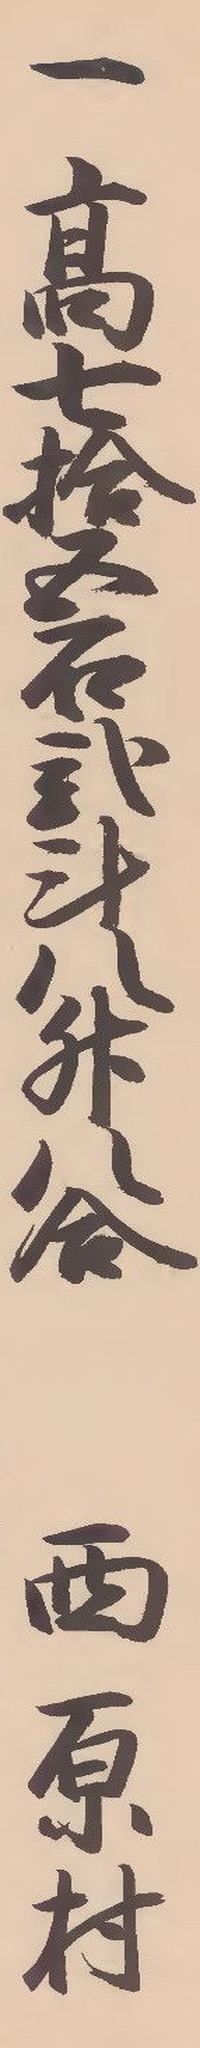一高七拾五石弐斗八升八合西原村
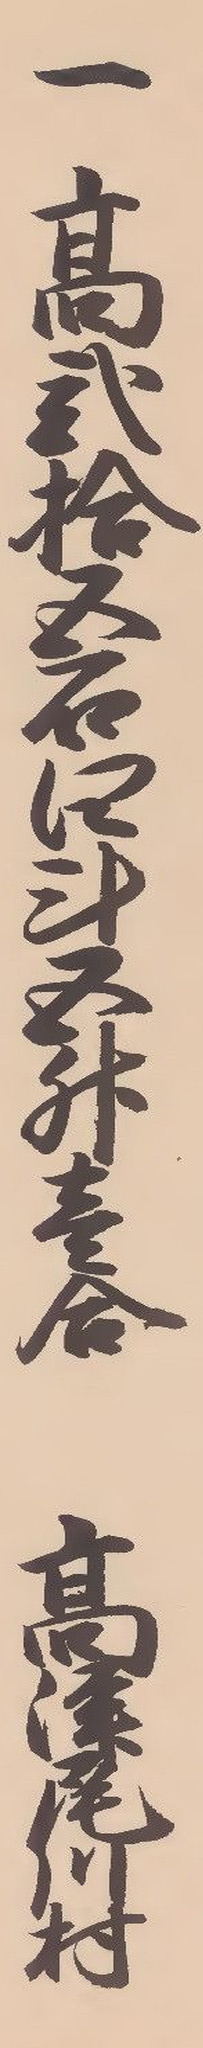一高弐拾五石四斗五升壱合高津尾川村
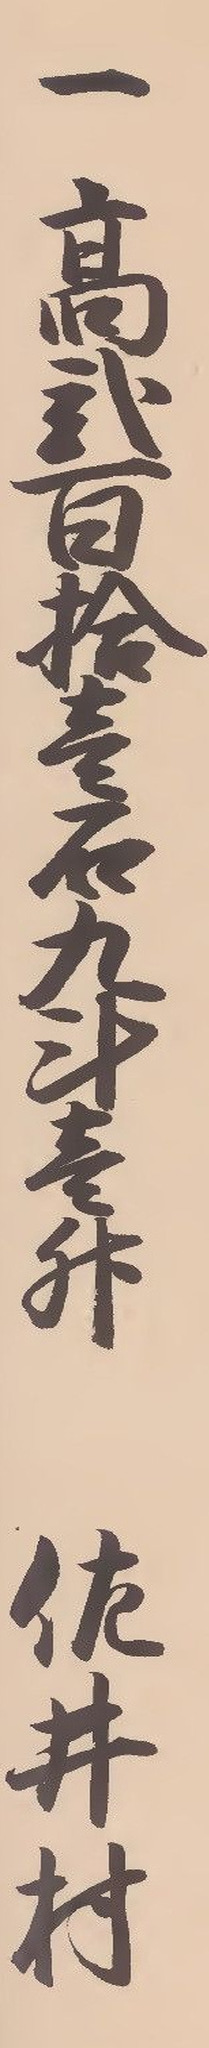一高弐百拾壱石九斗壱升佐井村
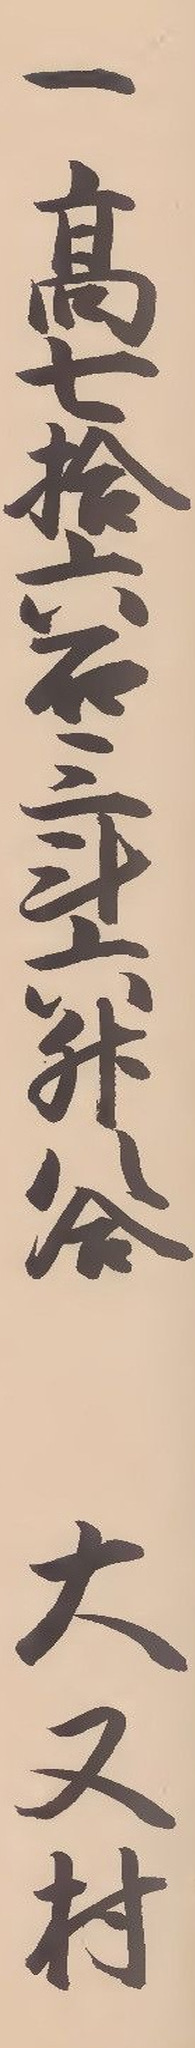一高七拾六石三斗六升八合大又村
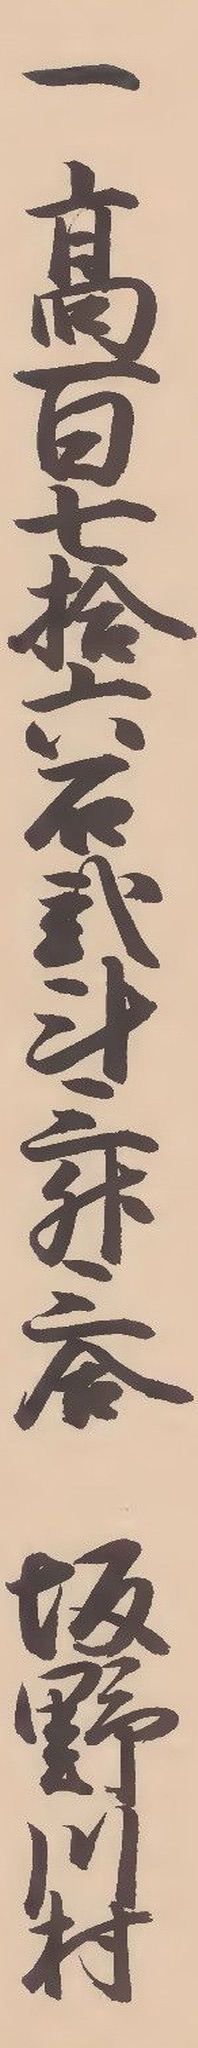一高百七拾六石弐斗三升三合坂野川村
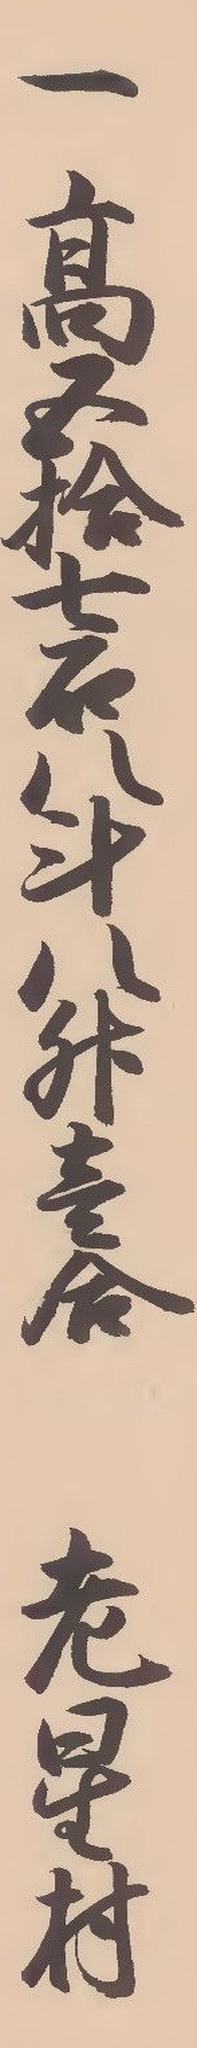一高五拾七石八斗八升壱合老星村
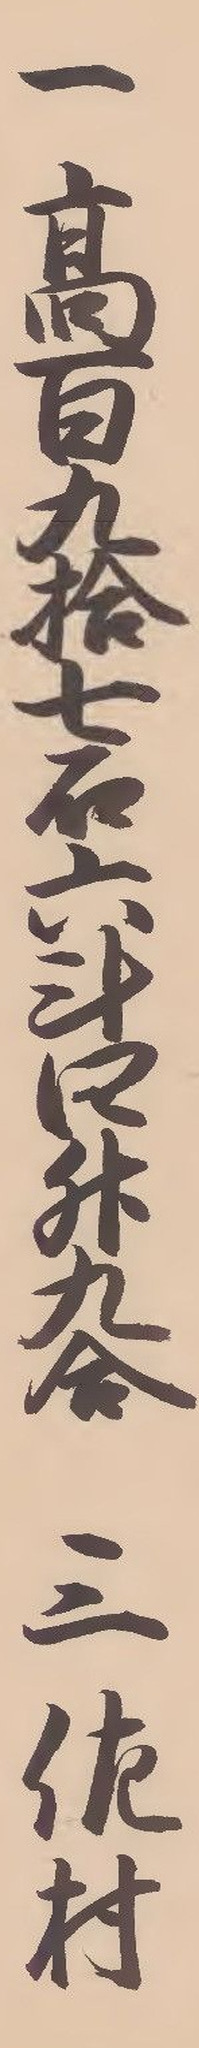一高百九拾七石六斗四升九合三佐村

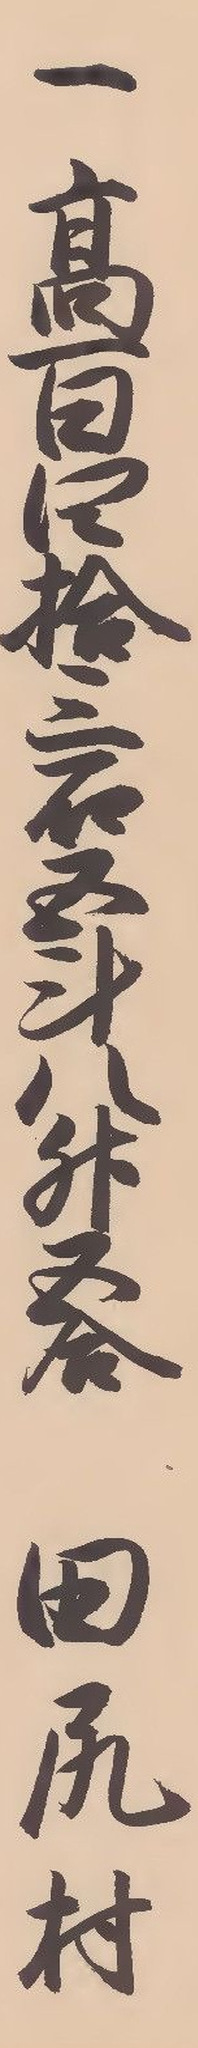一高百四拾三石五斗八升五合田尻村
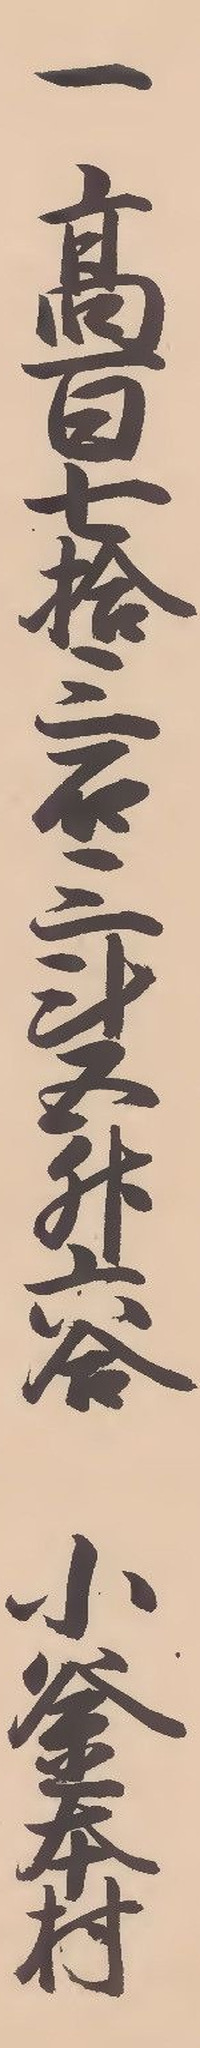一高百七拾三石三斗五升六合小釜本村
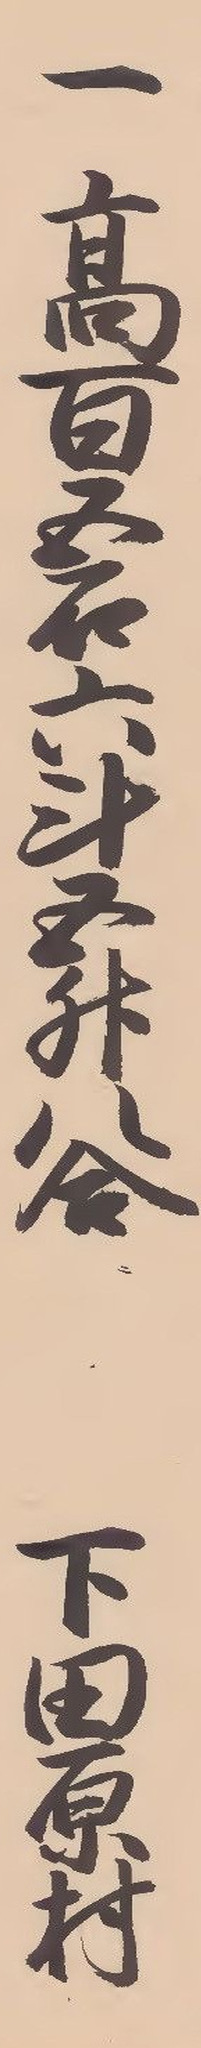一高百五石六斗五升八合下田原村
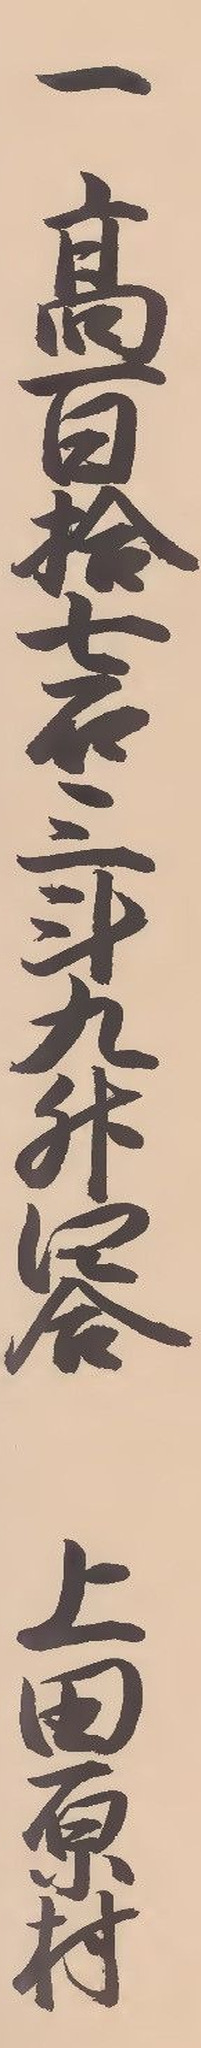一高百拾七石三斗九升四合上田原村
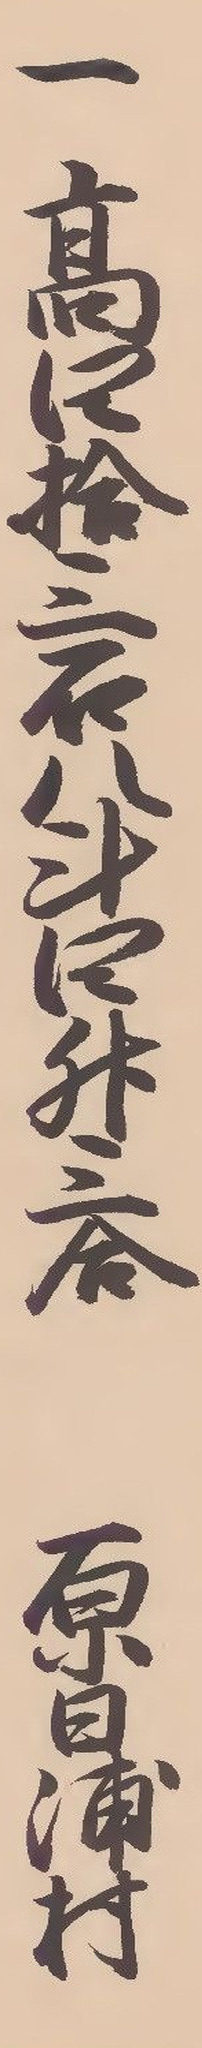一高四拾三石八斗四升三合原日浦村

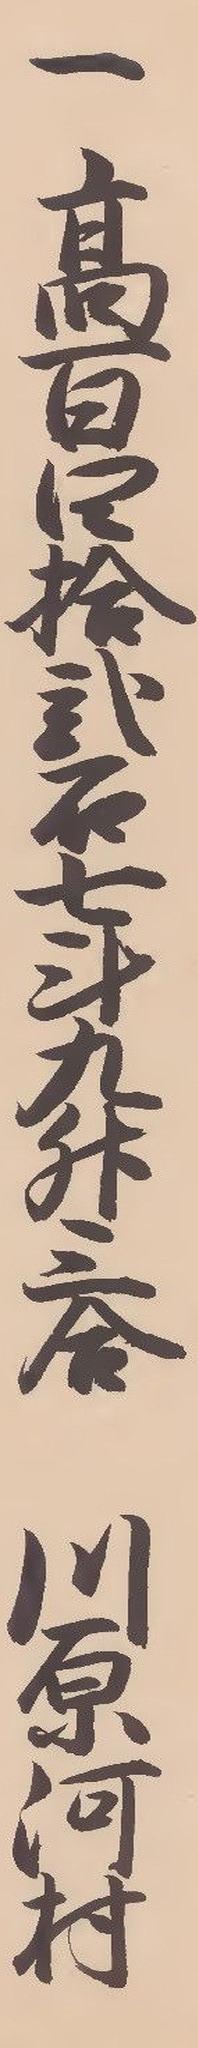一高百四拾弐石七斗九升三合川原河村
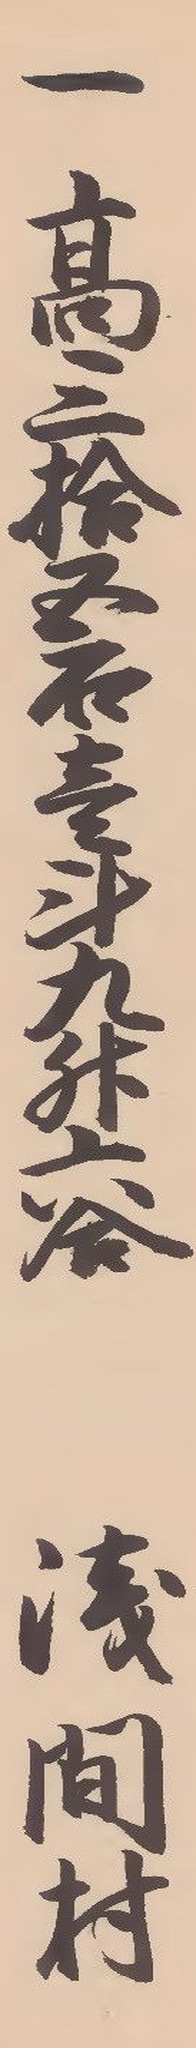一高三拾五石壱斗九升六合浅間村
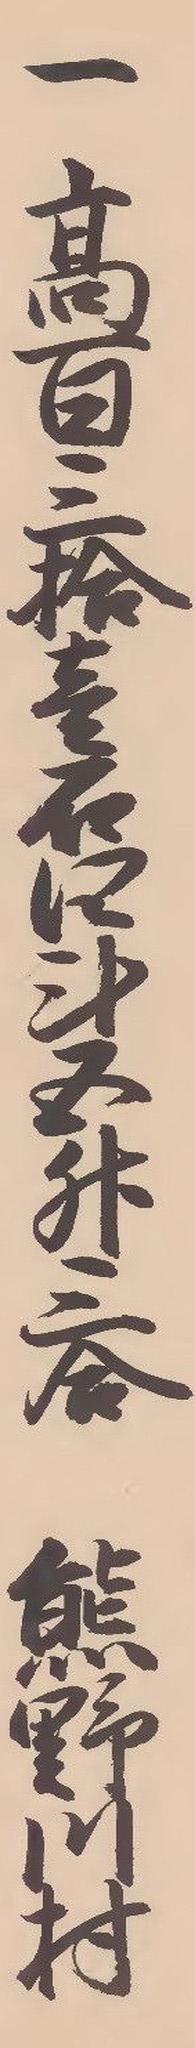一高百三拾壱石四斗五升三合熊野川村
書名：紀伊国郷帳
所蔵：国立公文書館 National Archives of Japan
